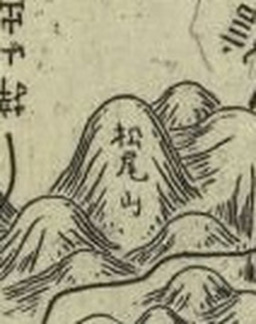松尾山
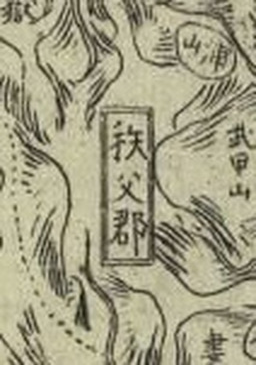秩父郡

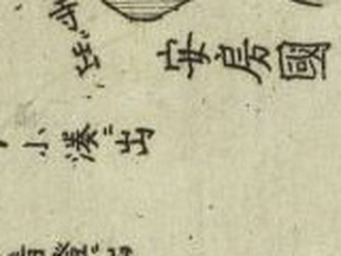小湊に出
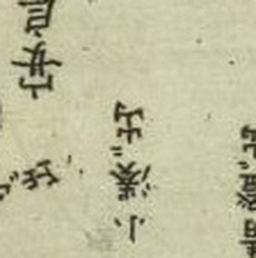小湊に出
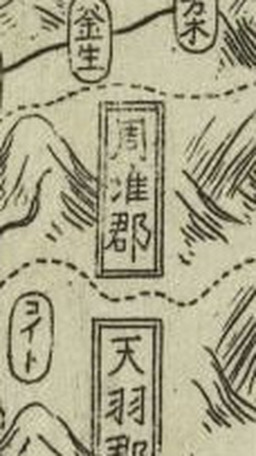周准郡
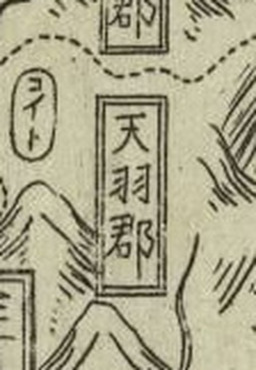天羽郡
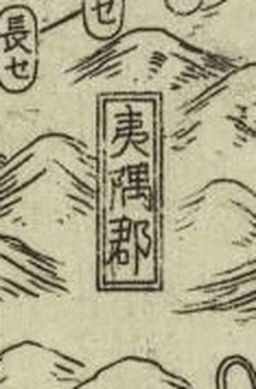夷隅郡
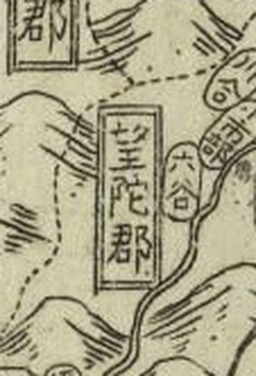望陀郡
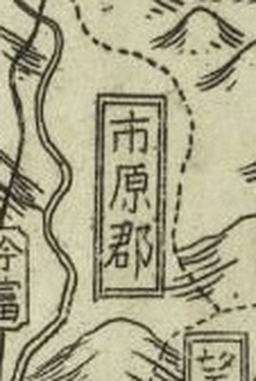市原郡
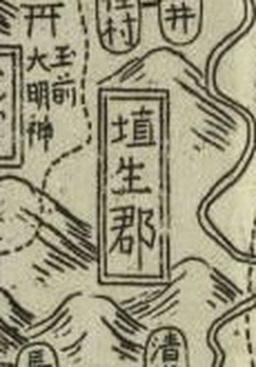埴生郡
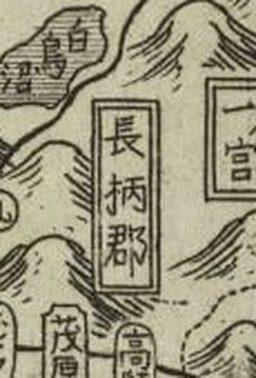長柄郡
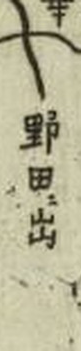野田に出
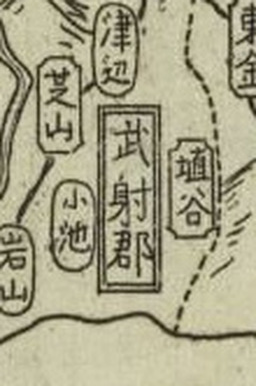武射郡

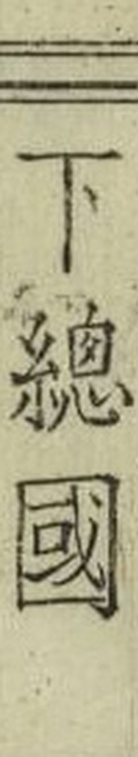下野国
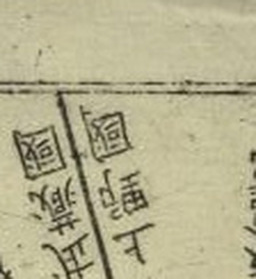下野国
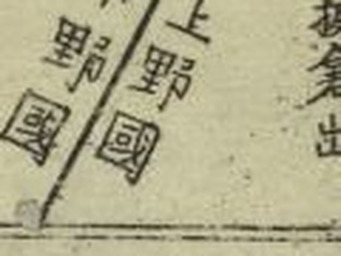下野国
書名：大日本国細図 東国之部 上
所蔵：University of the Ryukyus Library
